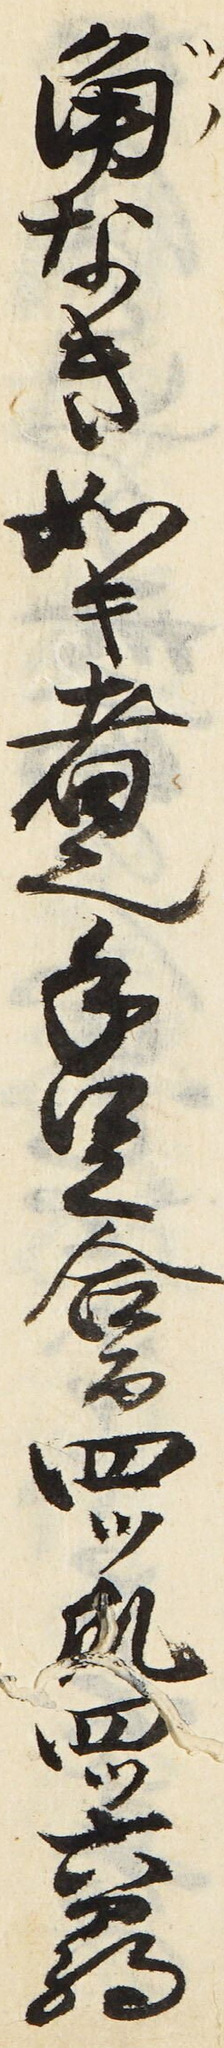角なき如き者也手足合而四ツ爪四つ六尋
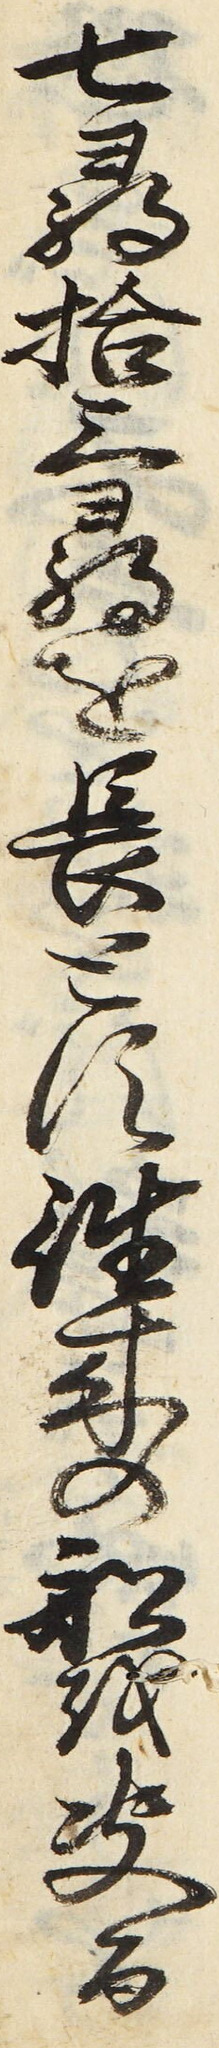七尋拾三尋を長とす往来の船を決而

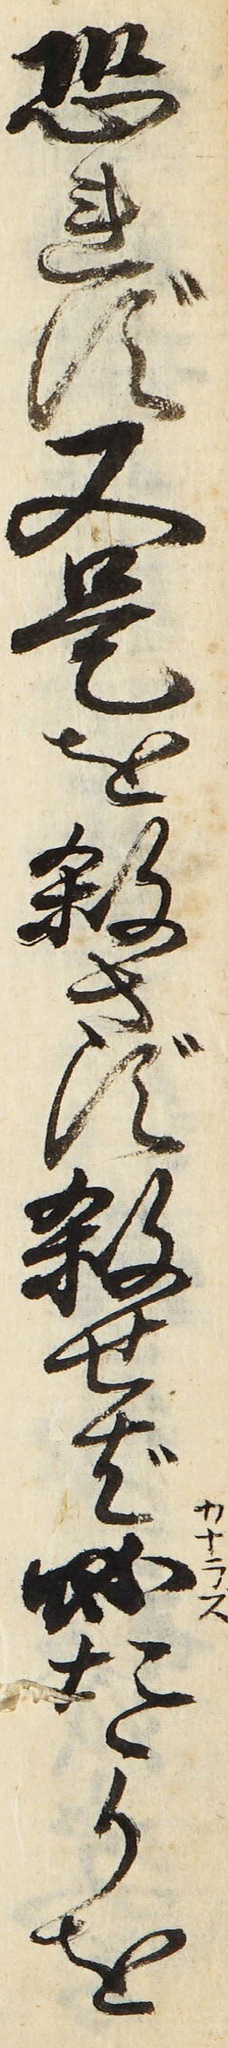恐れず又是を殺さず殺せば必たゝりを
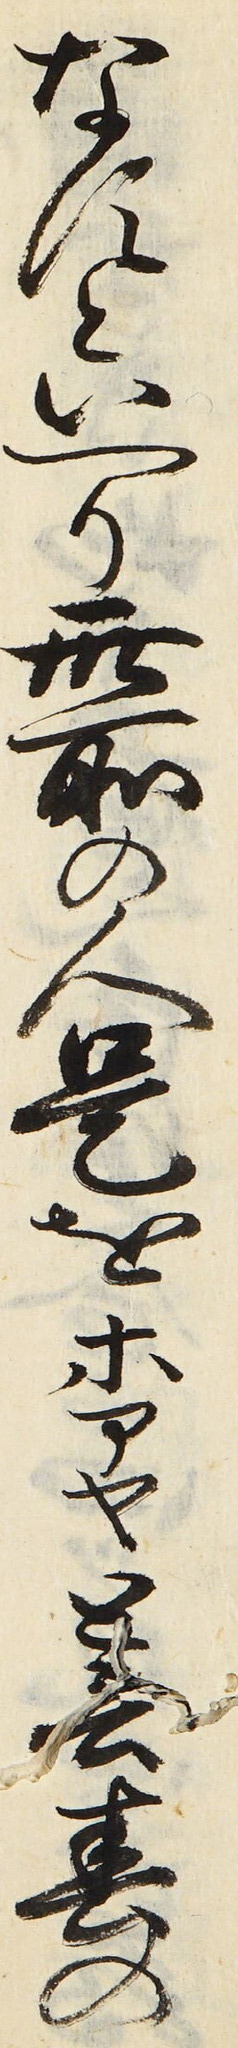なすといへり此所の人是をホアヤと云春の
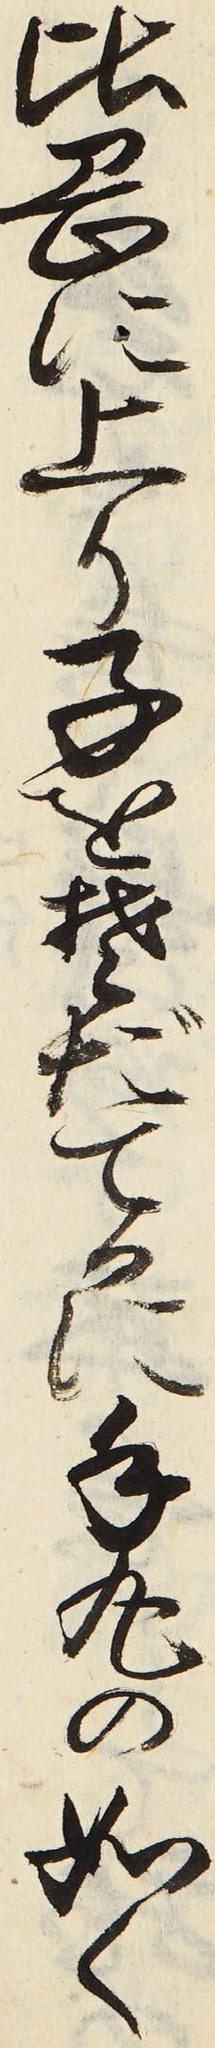頃岡に上り子をそだてるに手丸の如く
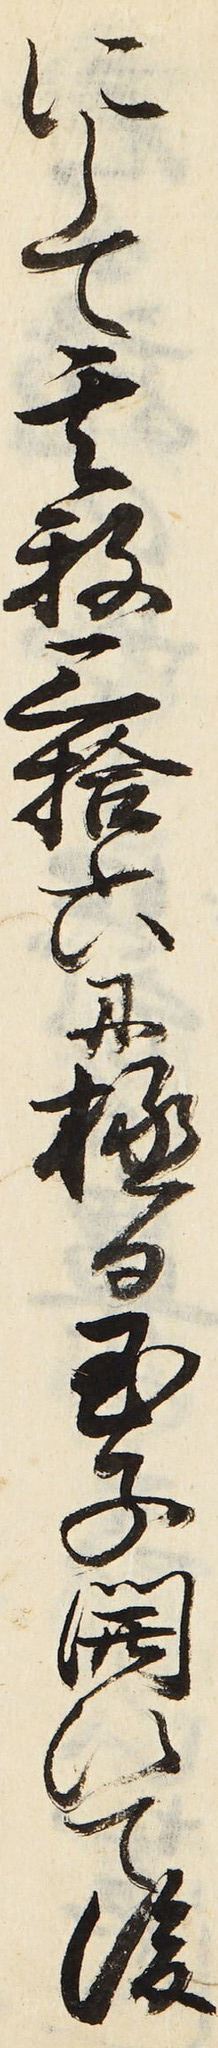にして其数三拾六に極る玉子開ひて後
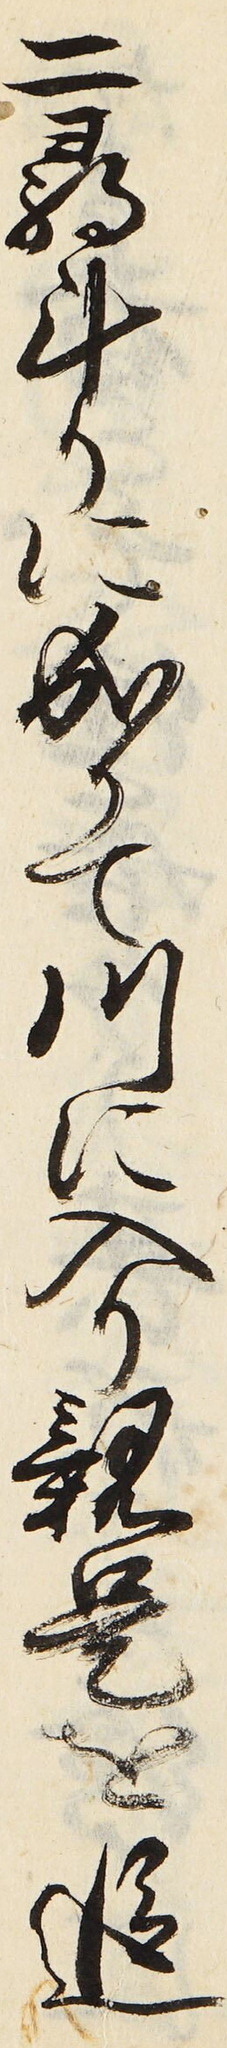二尋計りに成りて川に入り親是を追
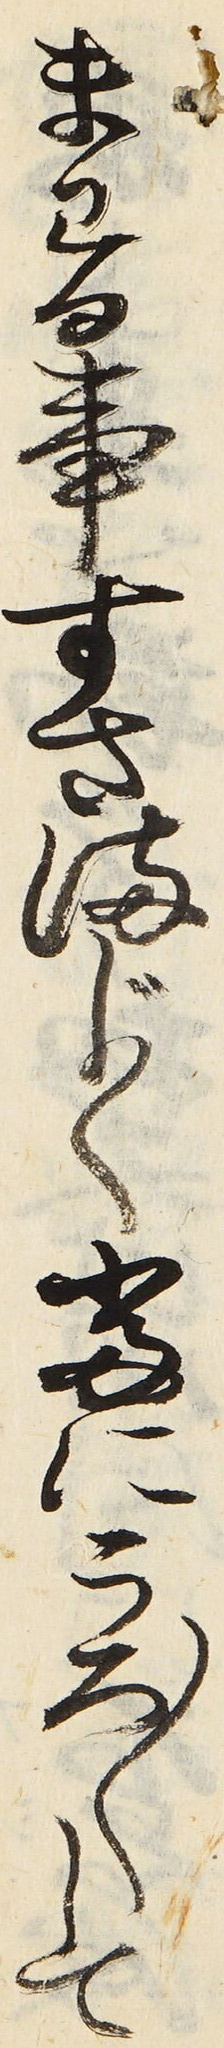まわる事すさまじく当にうろ〳〵して
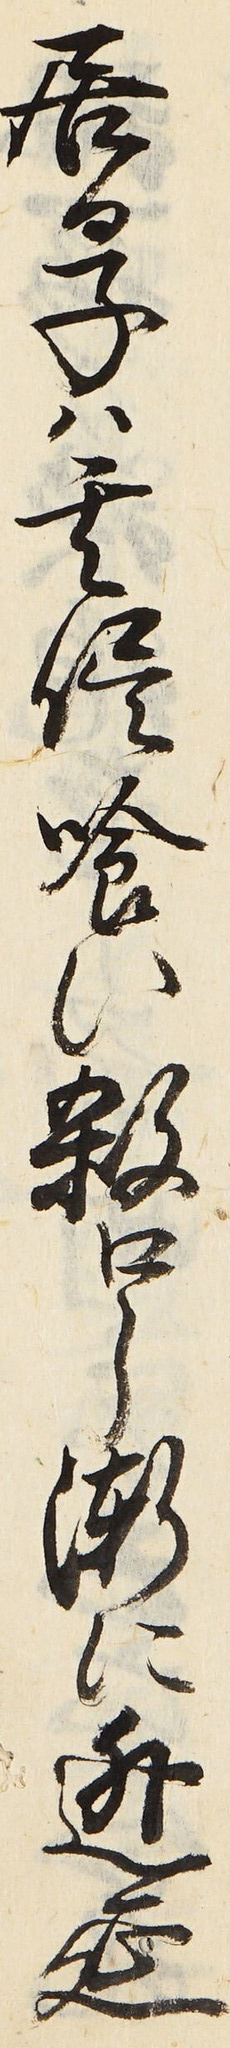居る子は其侭喰ひ殺ろし漸に逃延
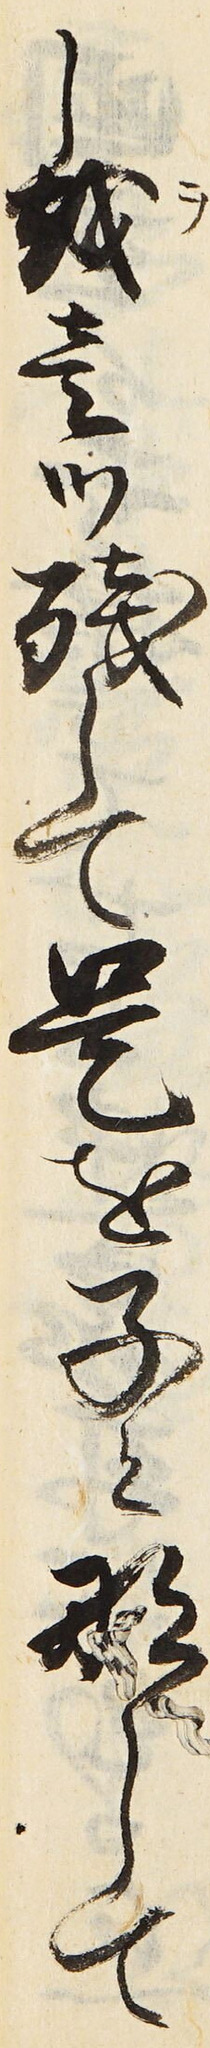し越壱ツ残して是を子となして
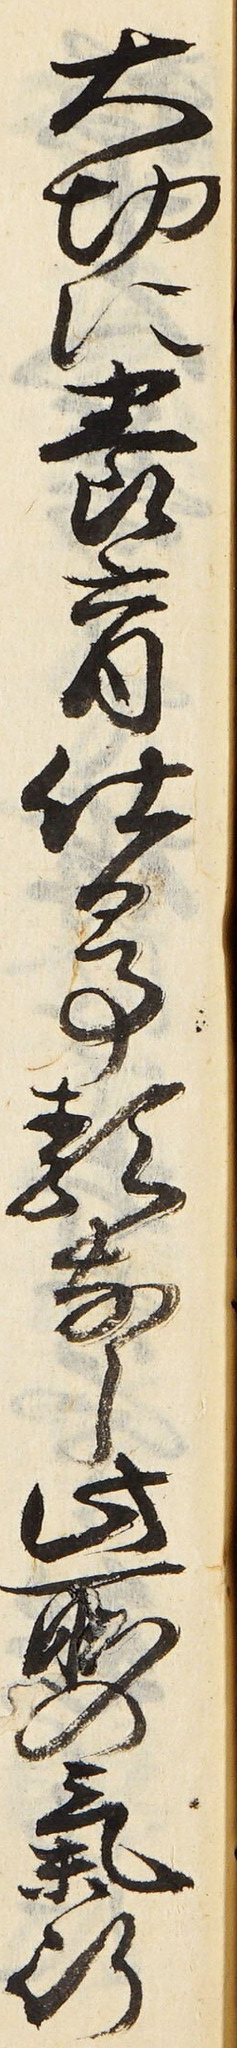大切に養育仕る事類なし此所の気行
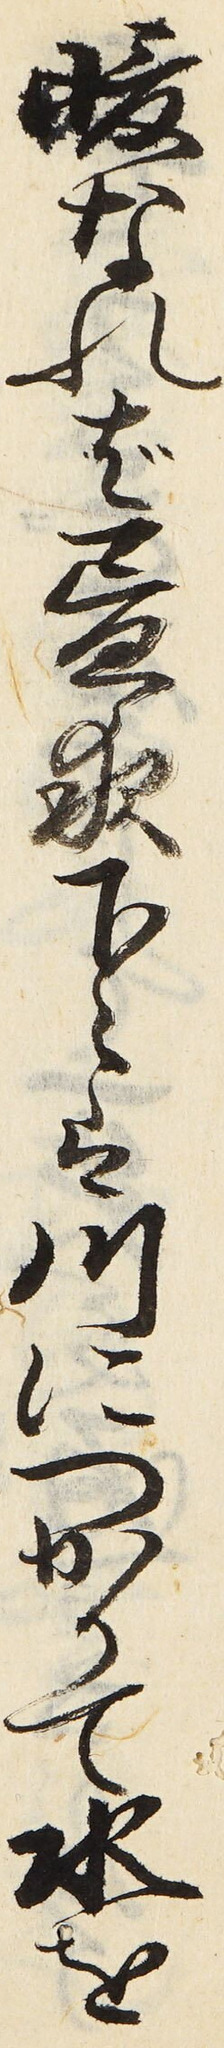暖なれば昼夜下々は川につかりて水を
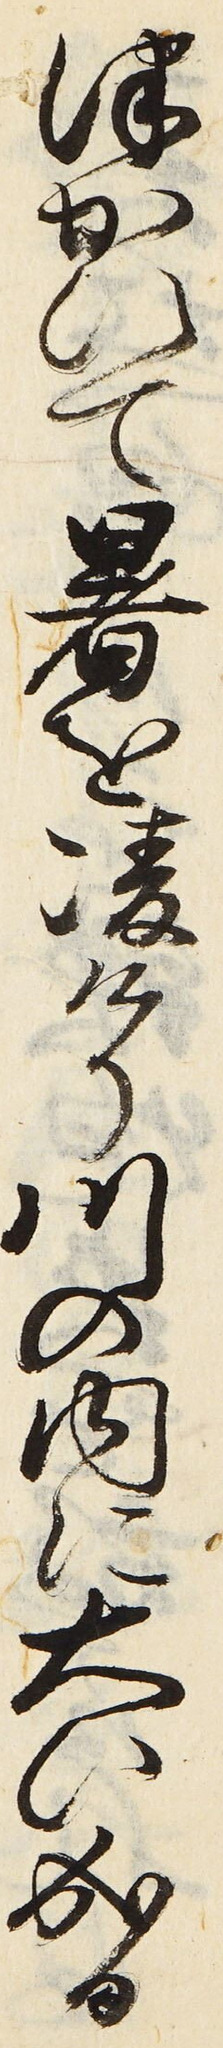つかひて暑を凌けり川の内に大ひ成る
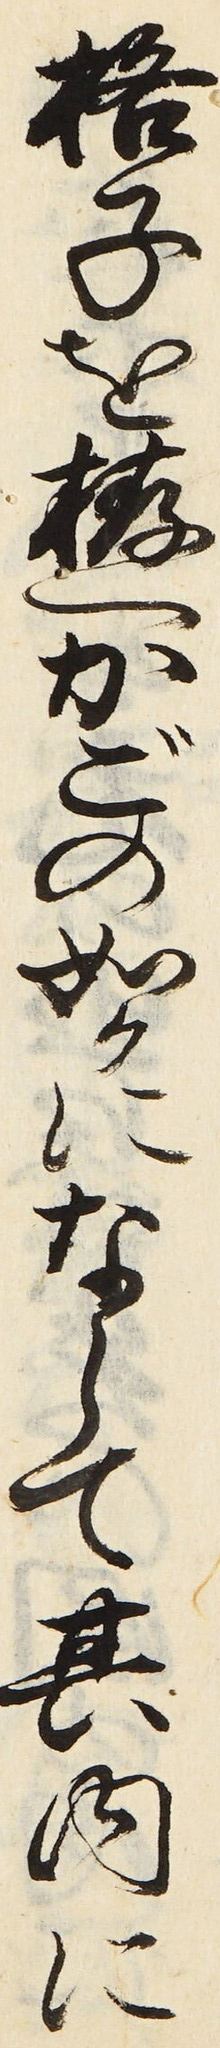格子を拵へかごの如くになして其内に
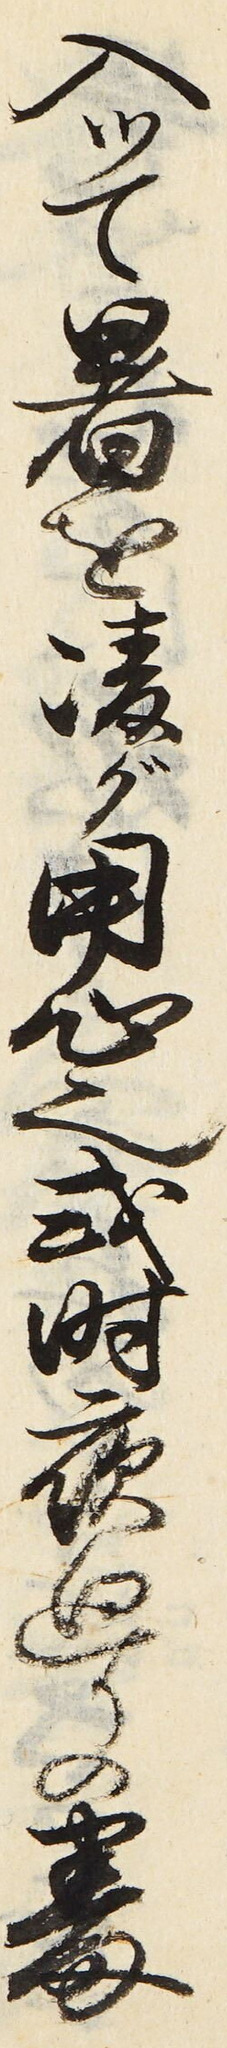入つて暑を凌ぐ用心也或時夜廻りの番
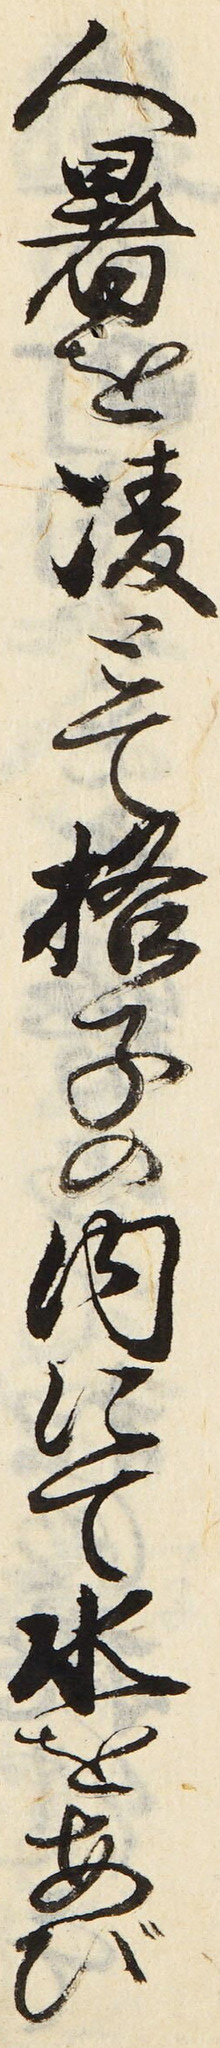人暑を凌とて格子の内にて水をあび
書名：華夷九年録
